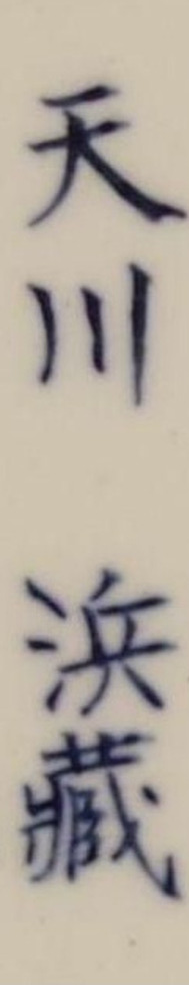天川浜蔵
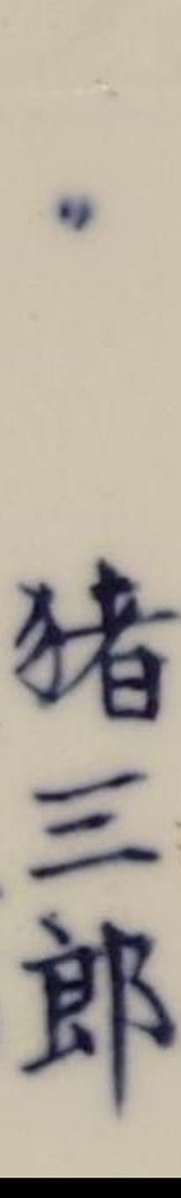猪三郎
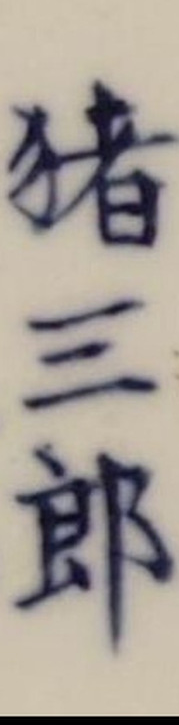猪三郎
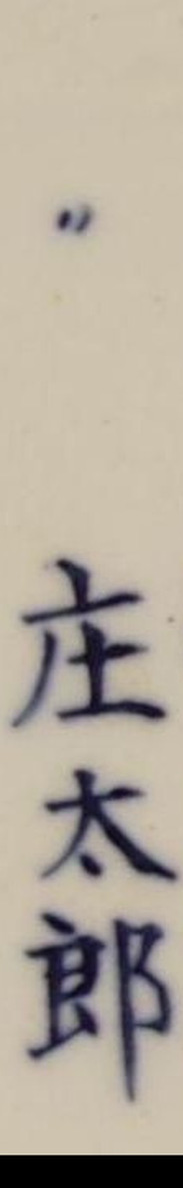庄太郎
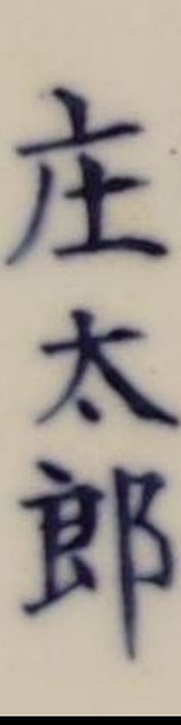庄太郎
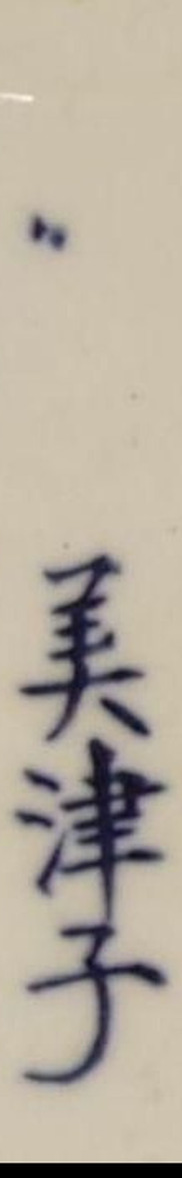美津子
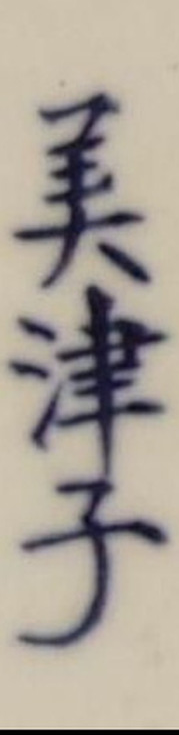美津子
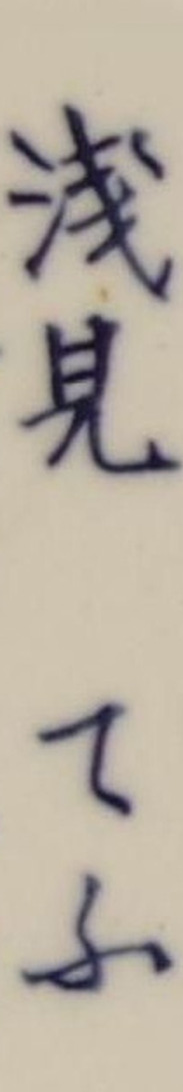浅見てふ
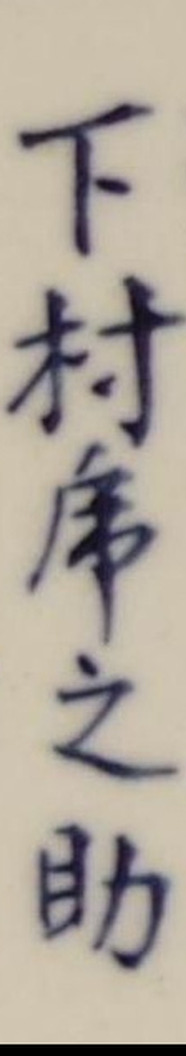下村虎之助

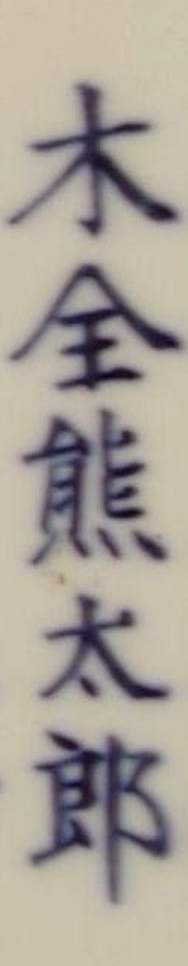木全熊太郎
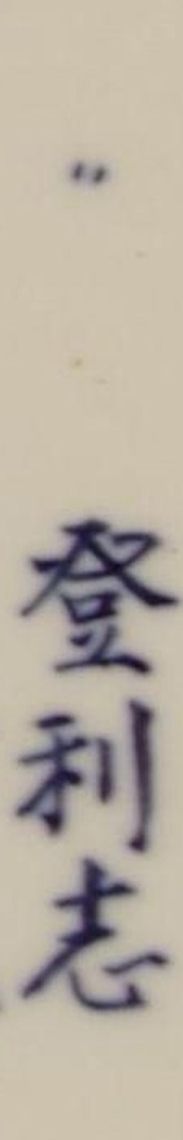登利志
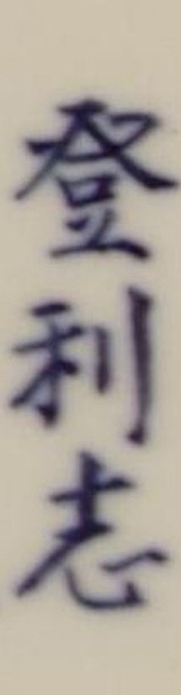登利志
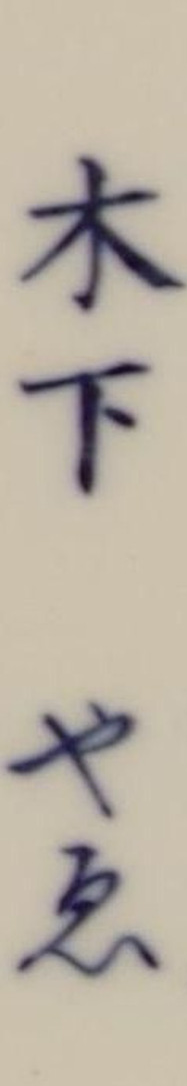木下やえ
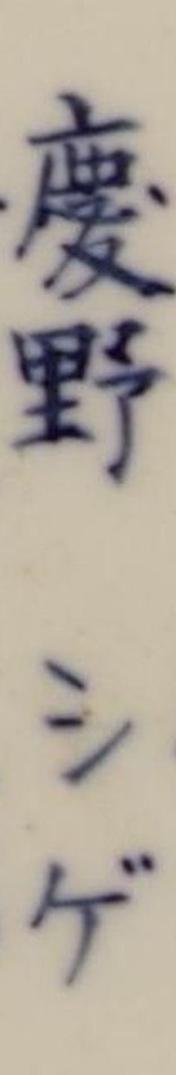慶野シゲ
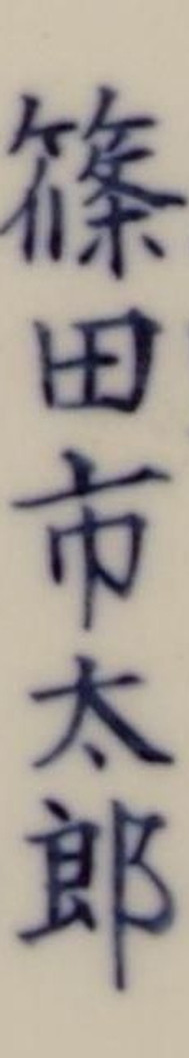篠田市太郎
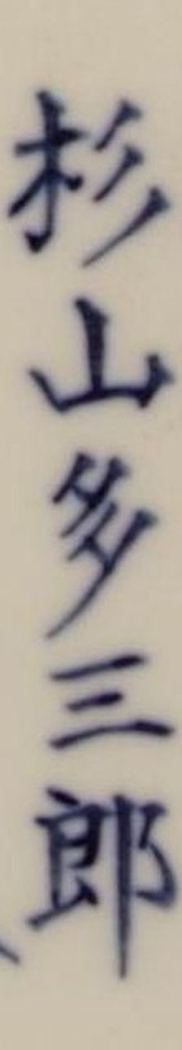杉山多三郎
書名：E~L
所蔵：高野山金剛峯寺
